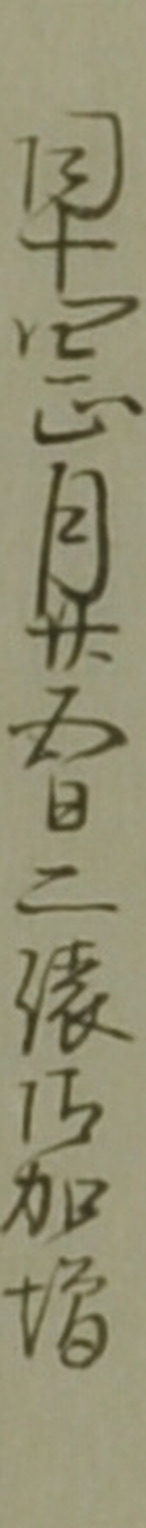一同十四正月廿五日二俵御加増
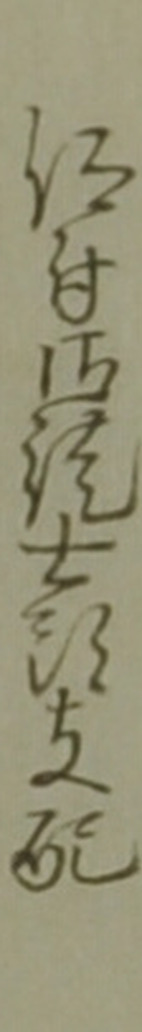仰付御徒士頭支配
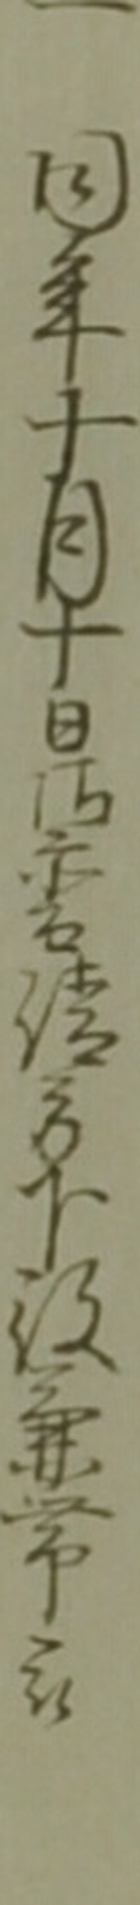一同年十月十日御普請方下役兼帯被
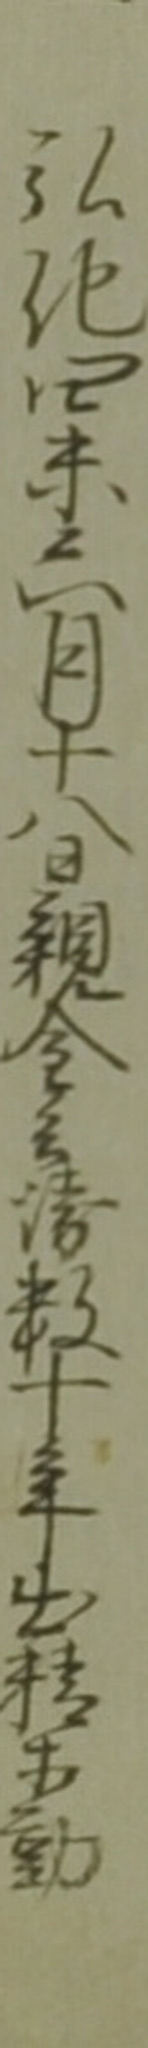一弘化四未六月十八日親金兵衛数十年出精相勤
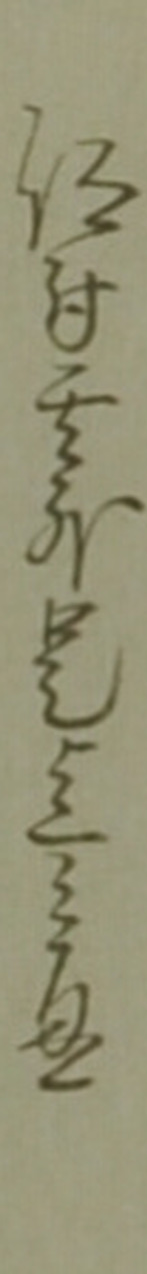仰付其外是迄之通
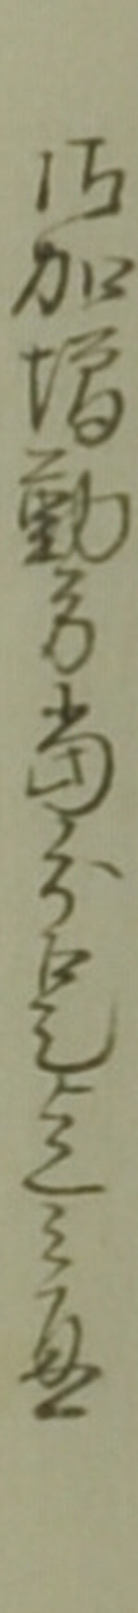御加増勤方当分是迄之通
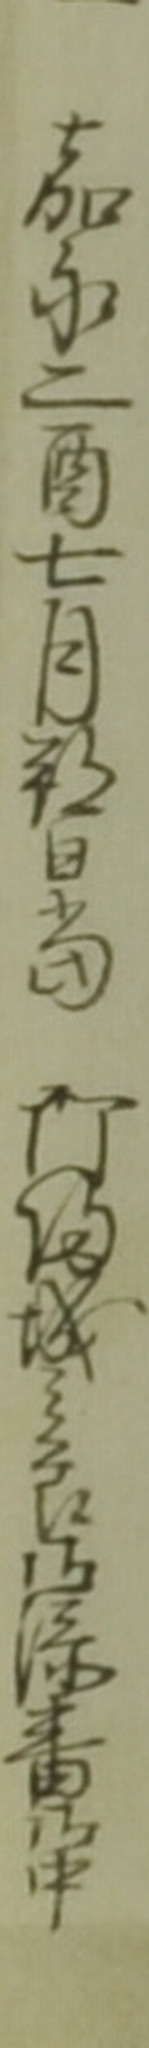一嘉永二酉七月朔日当御帰城之節御添番御中

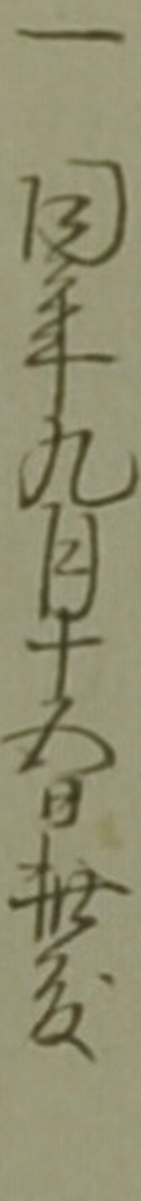一同年九月十五日此度
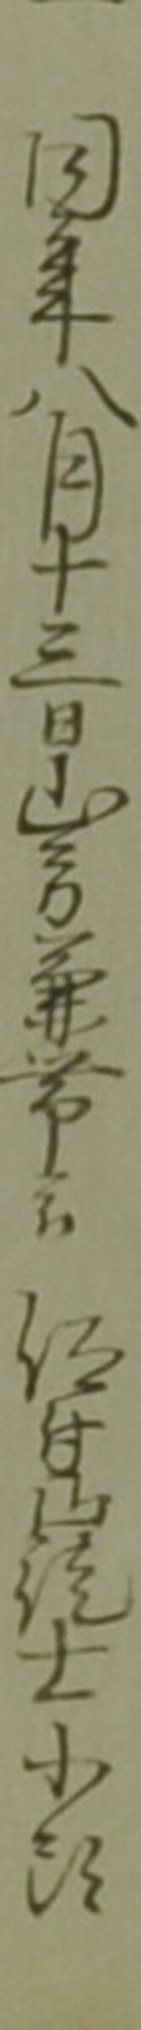一同年八月十三日山方兼帯被仰付御徒士小頭
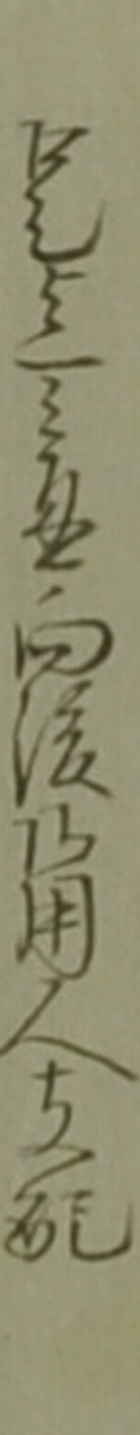是迄之通向後御用人支配
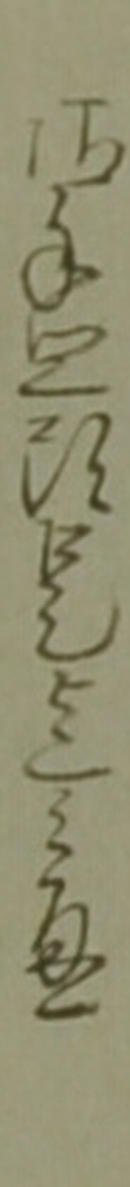御手廻頭是迄之通
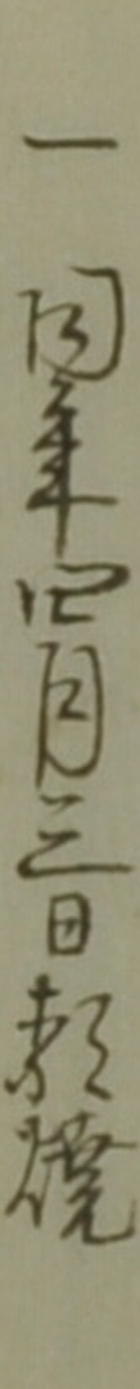一同年四月三日類焼
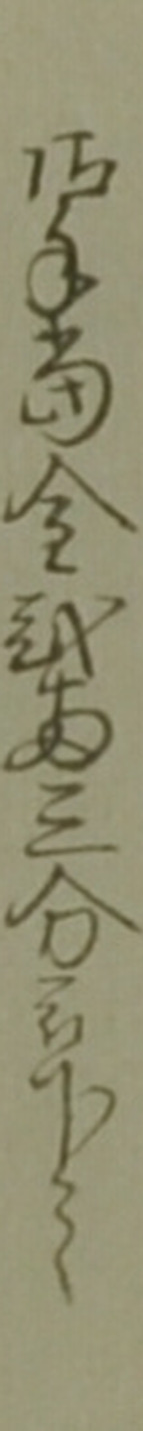御手当金弐両三分被下之
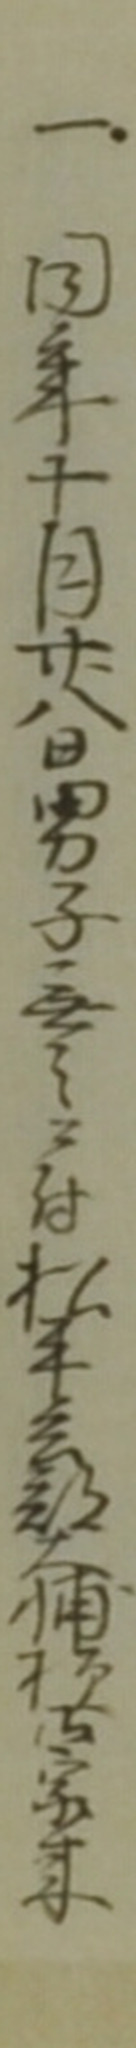一同年十月廿八日男子無之ニ付松平兵部大輔様御家来
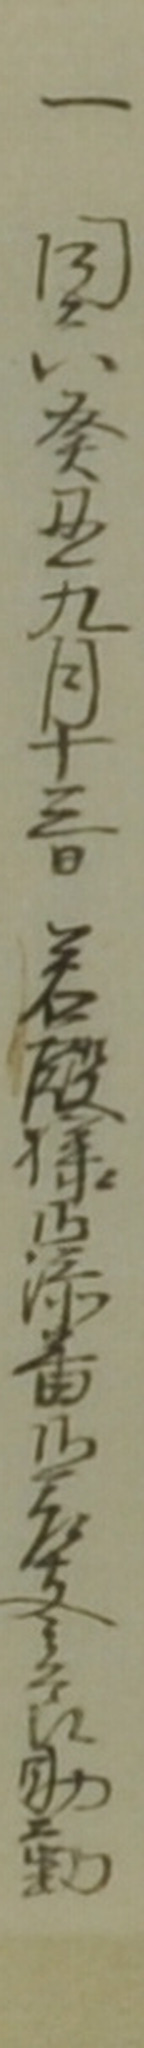一同六癸丑九月十三日若殿様御添番御差支之節助勤
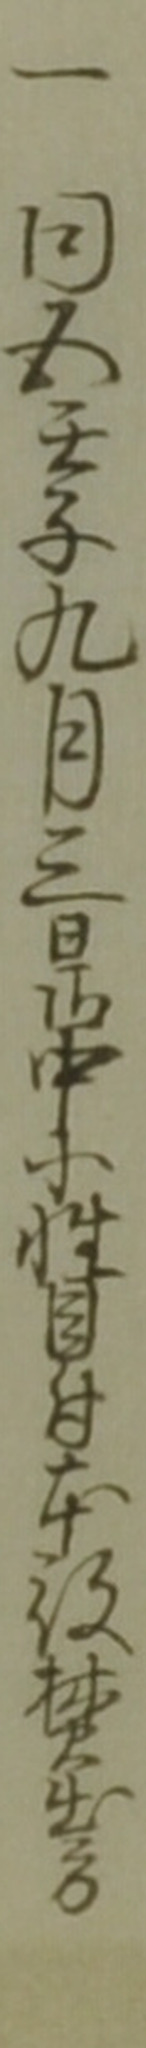一同五壬子九月三日御中小性目付本役焚出方
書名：無足諸士勤仕録（一）
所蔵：伊那市立高遠町図書館・合同会社AMANE
